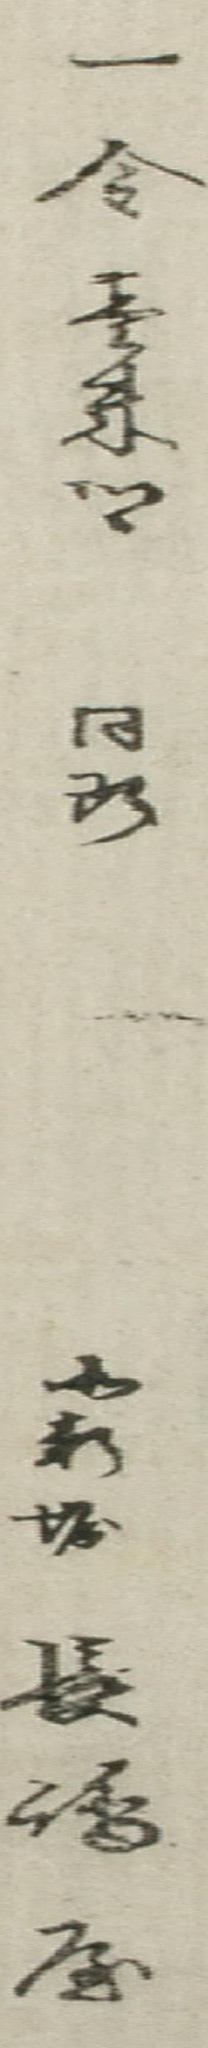一金壱朱ツゝ同断北新堀長嶋屋
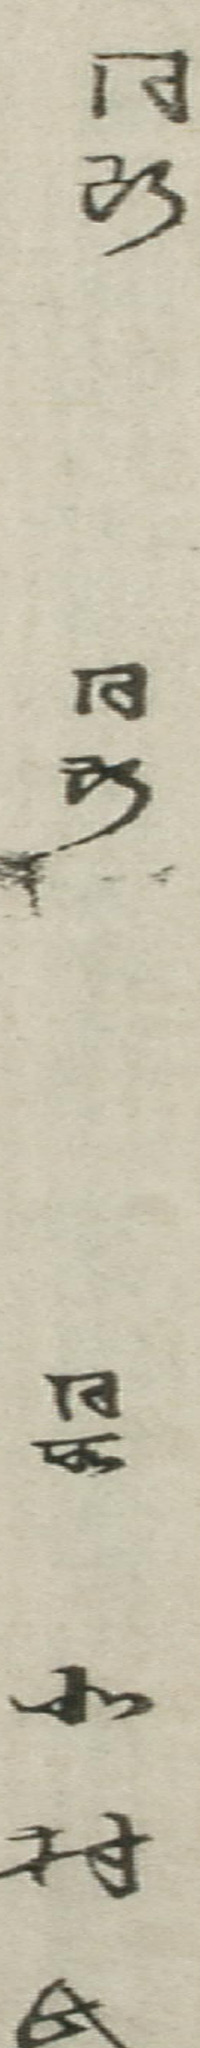一同断同断同所北村氏
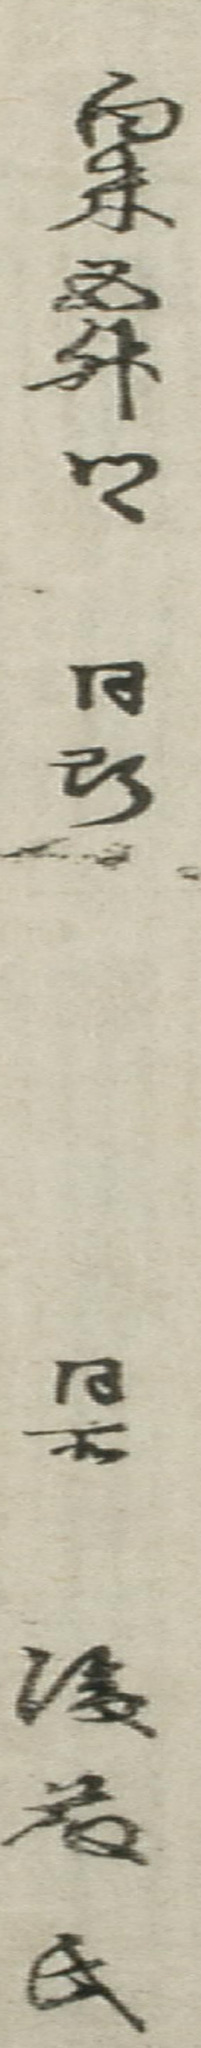一白米五升ツゝ同断同所後藤氏
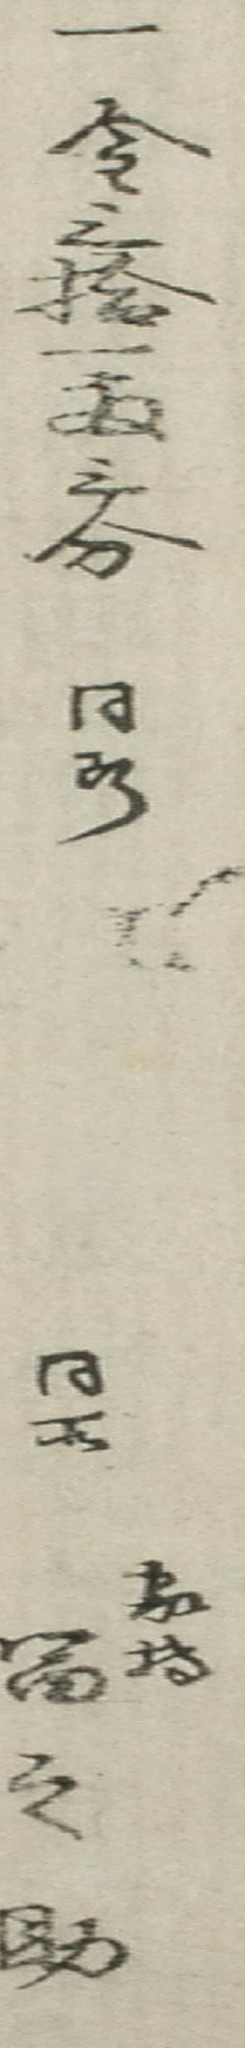一金三拾一両三分同断同所家持冨之助
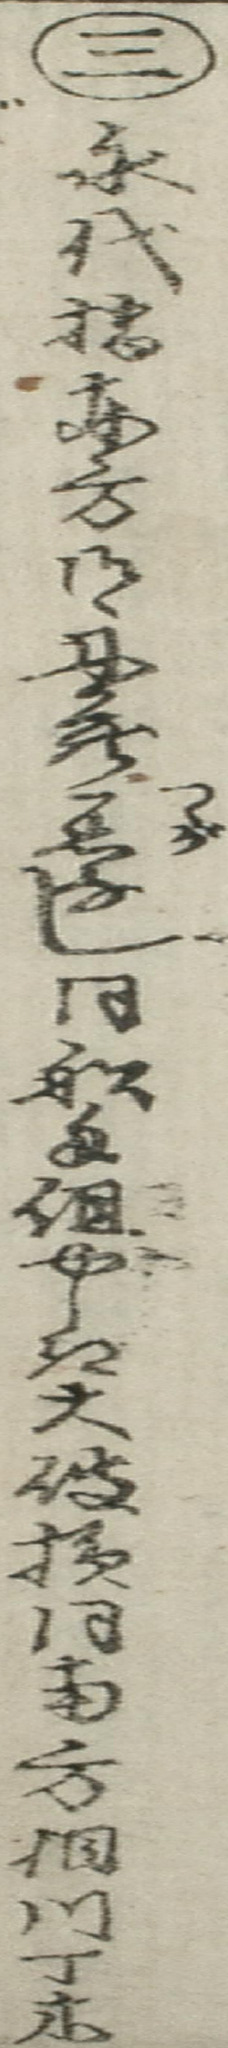永代橋東方御舟蔵恙つつがなし同船手組やしき大破損同南方相川丁木
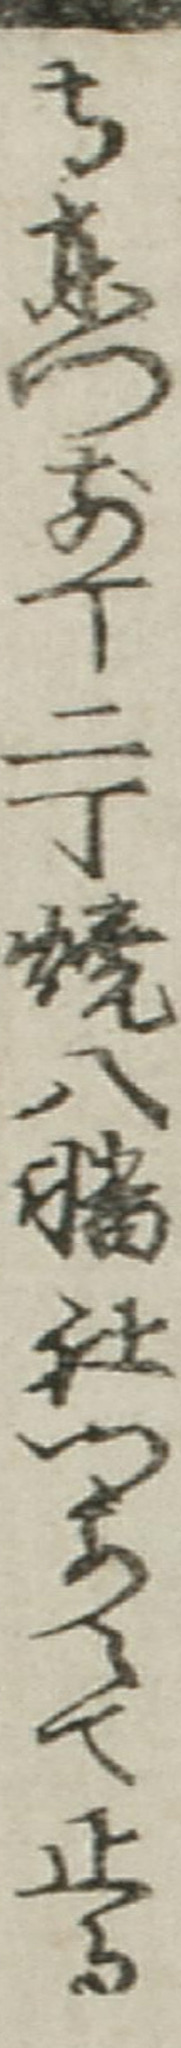寺東門前丁二丁焼八幡社門前にて止る

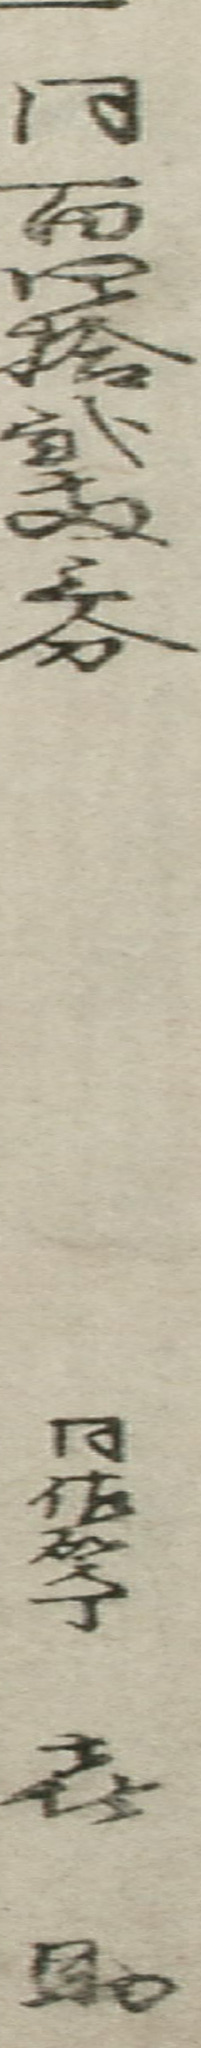一同百四拾弐両三分同佐賀町喜助
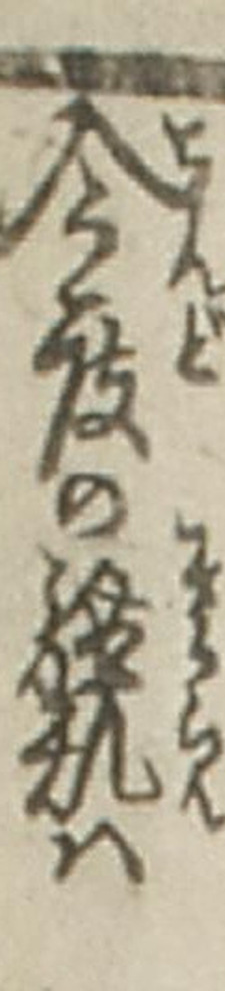今度の騒乱は
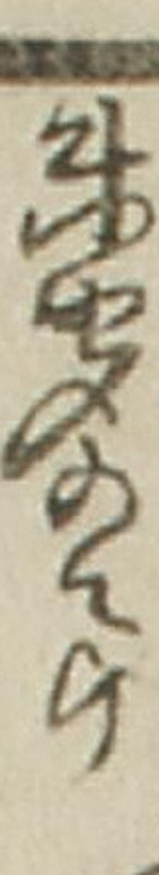未聞の事
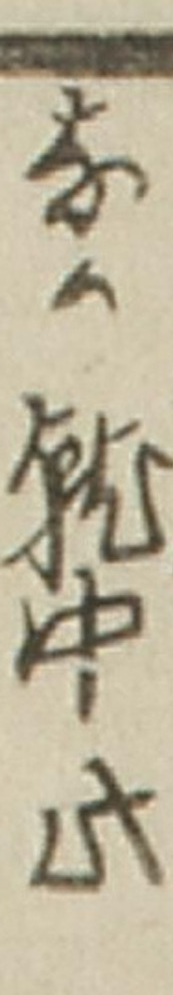なり就中此
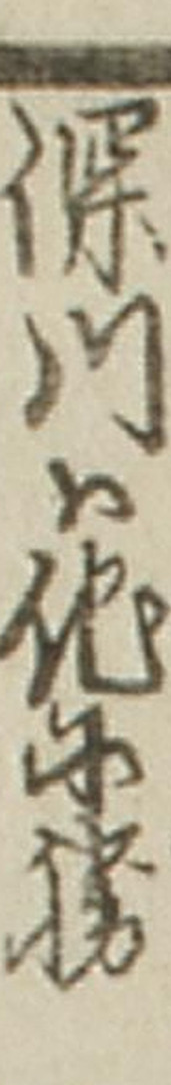深川は他に勝
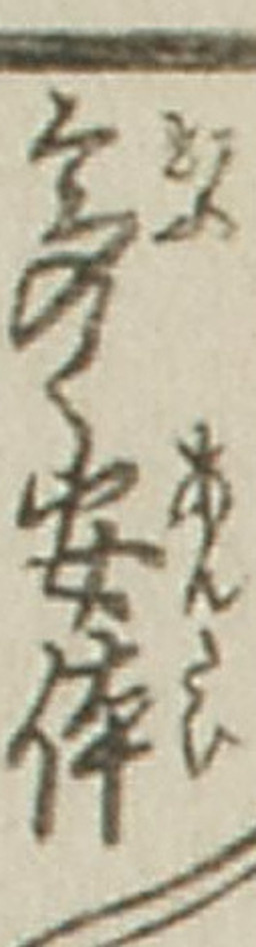多く安体
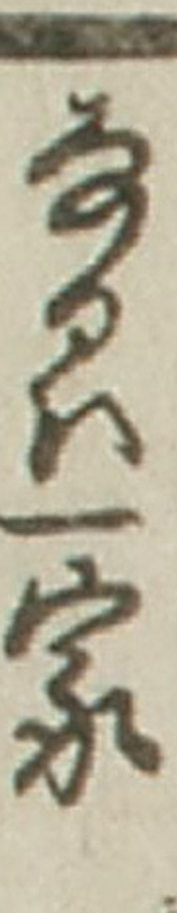なるは一家
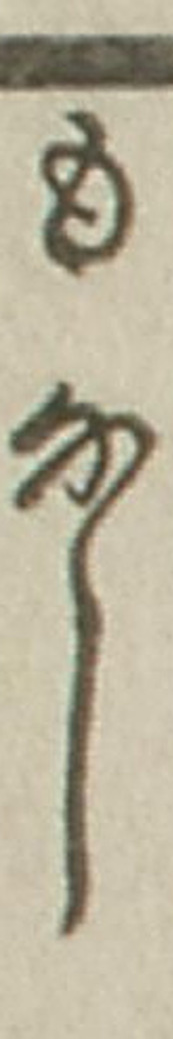もなし

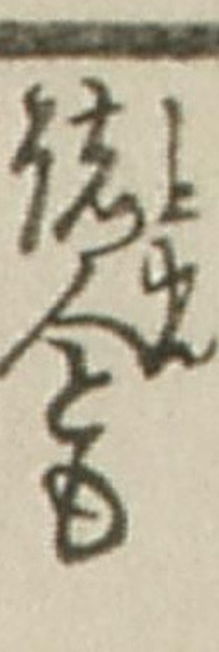諸人とも
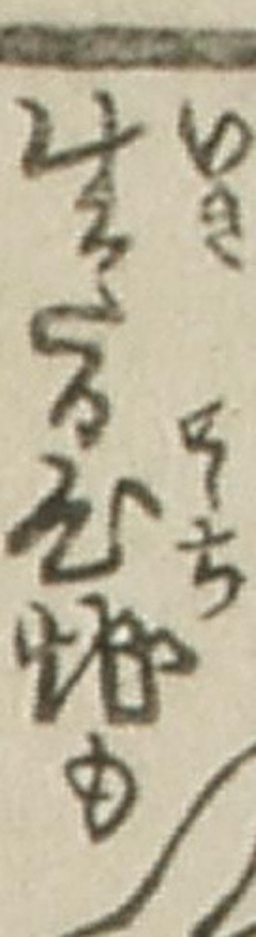生たる心地も
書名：安政見聞誌　上
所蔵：東京大学地震研究所図書室 Earthquake Research Institute Library, The University of Tokyo, JAPAN
